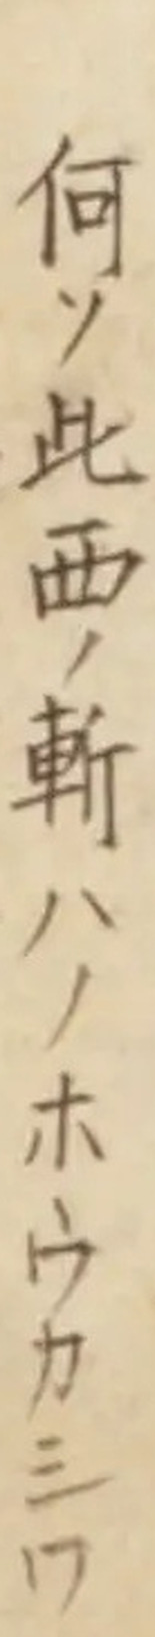何ソ此西ノ斬ハノホウカシワ
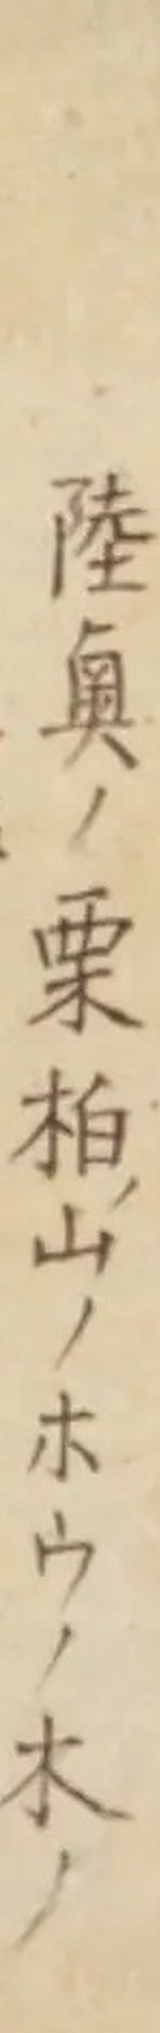陸奥ノ栗柏ノ山ノホウノ木ノ
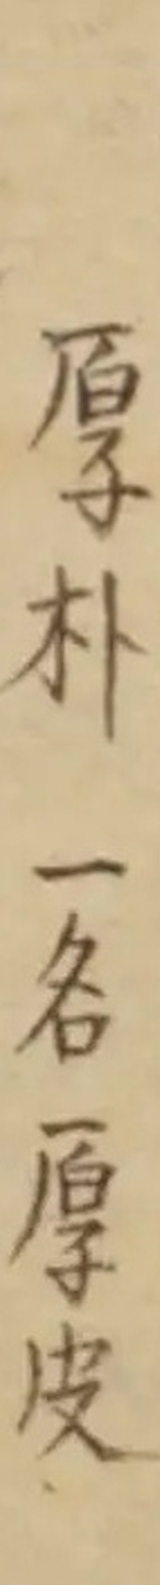厚朴一名厚皮
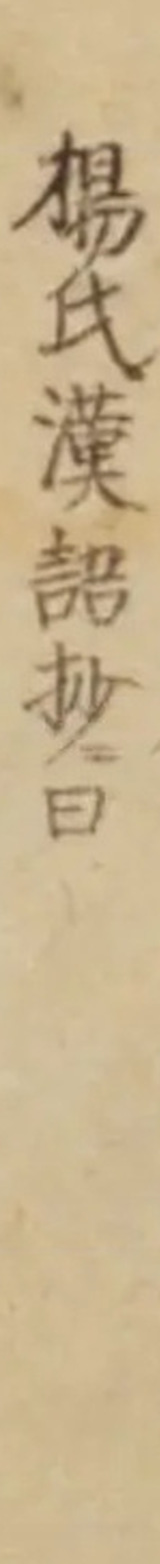楊氏漢語抄ニ曰
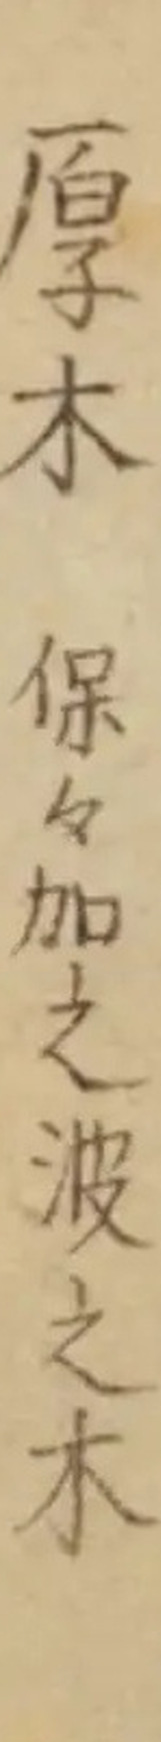厚木保々加之波之水
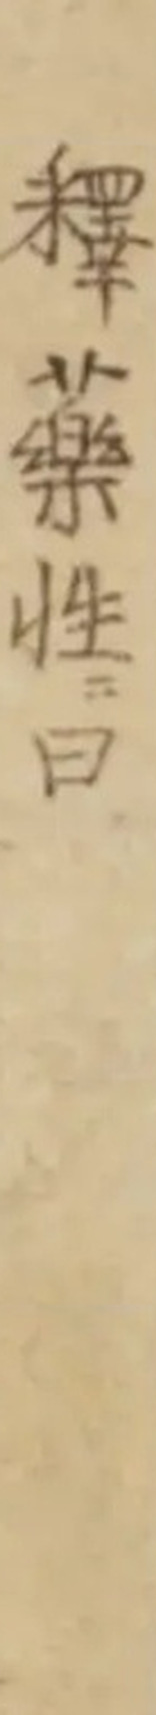釋薬性ニ曰
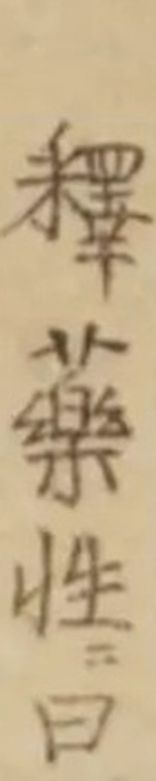釋薬性ニ曰
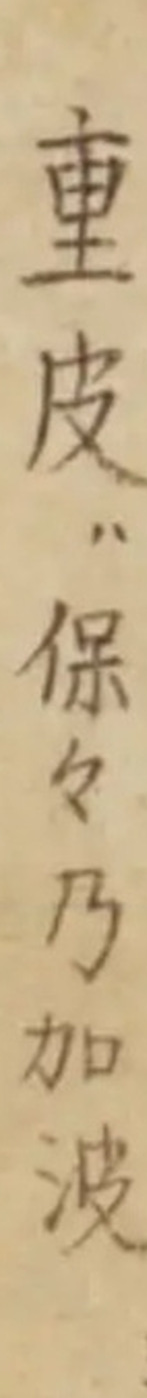重川皮ハ保々乃加波
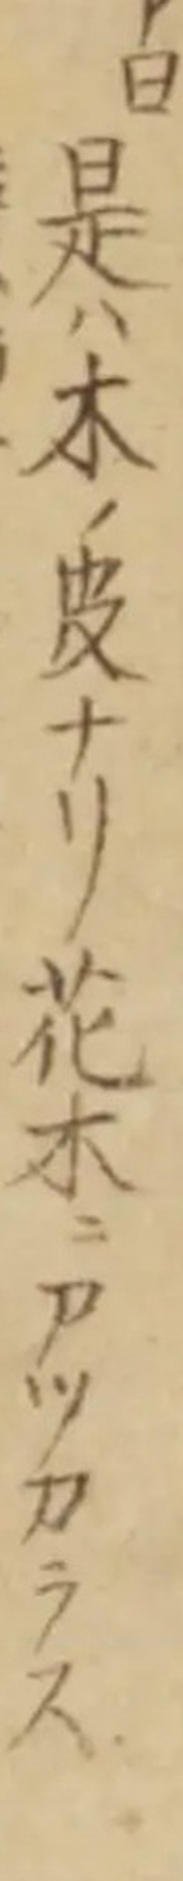是ハ木ノ皮ナリ花木ニアツカラス
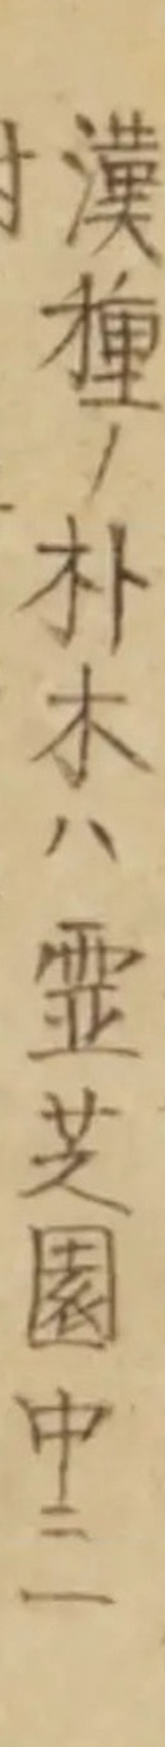漢種ノ朴木ハ霊芝園中ニ一
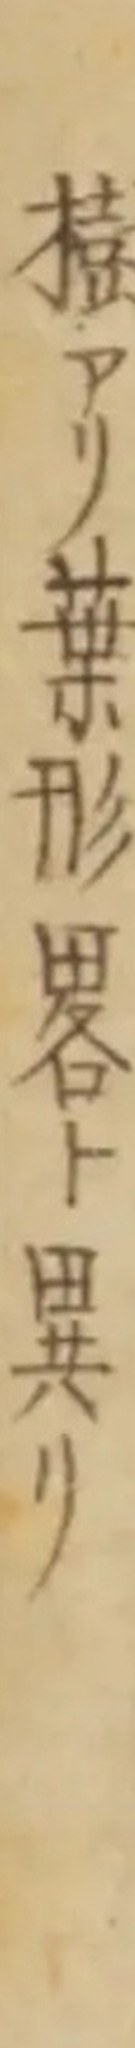樹アリ葉形畧ト異リ

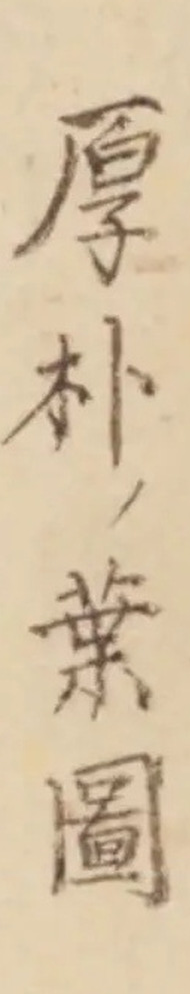厚朴ノ葉圖

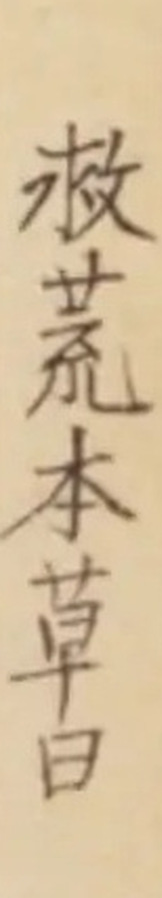救荒本草曰
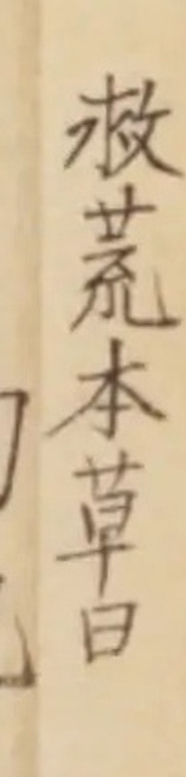救荒本草曰
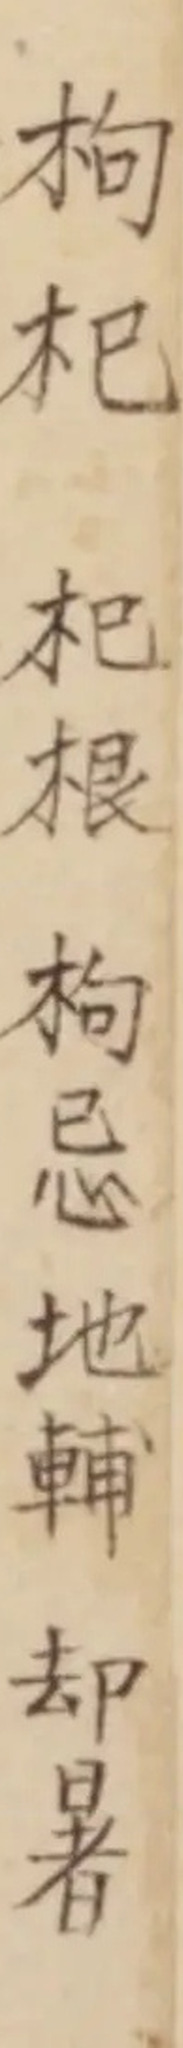枸杞枸根枸忌地輔却暑
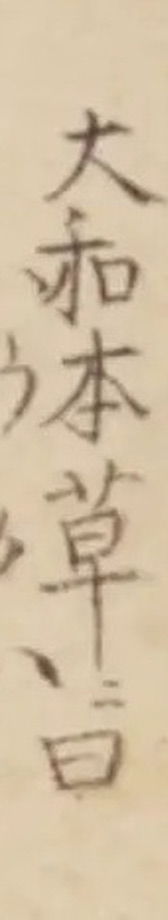大和本草ニ曰
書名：梅園草木花譜夏之部. 1
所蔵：国立国会図書館 National Diet Library, JAPAN
